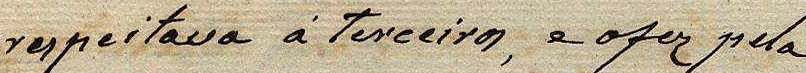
respeitava á terceiros, e o fez pela
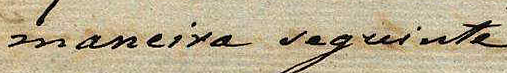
maneira seguinte.
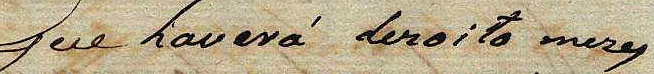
Que haverá dezoito mezes
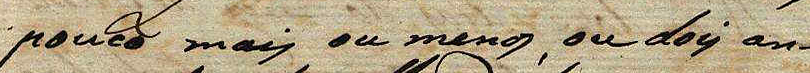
pouco mais ou menos, ou dois an
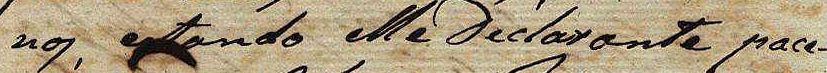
nos, estando elle Declarante pace
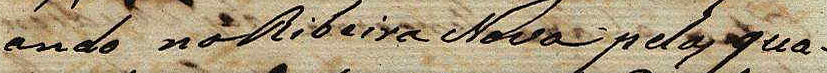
ando na Ribeira Nova pelas qua
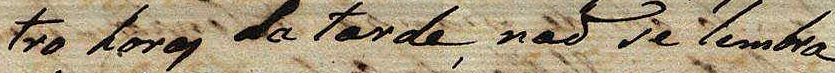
tro horas da tarde, naõ se lembra
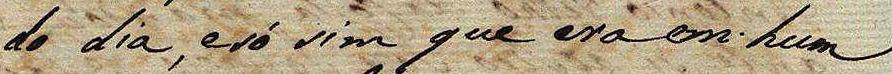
do dia, e só sim que era em hum
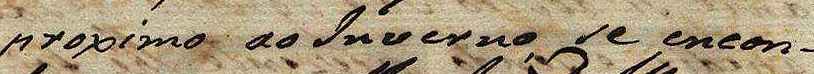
proximo ao Inverno se encon
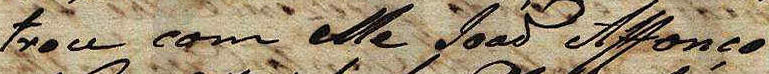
trou com elle Joaõ Affonço
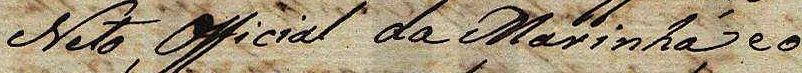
Neto Official da Marinha e o
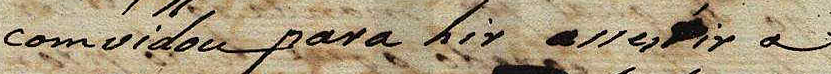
comvidou para hir assestir a
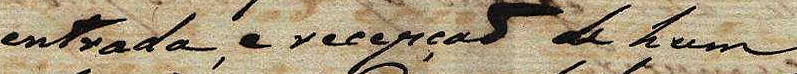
entrada, e recepçaõ de hum
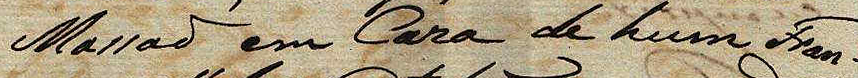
Massaõ em Caza de hum Fran
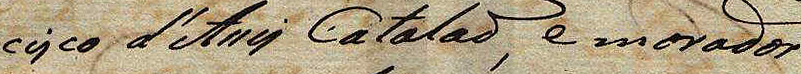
cisco d'Assis Catalaõ, e morador
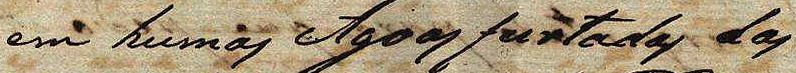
em humas Agoas furtadas das
